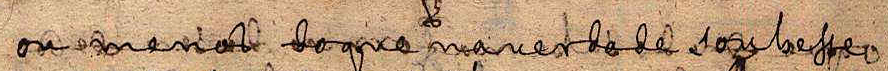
ou menos do que na uerdade soubesse
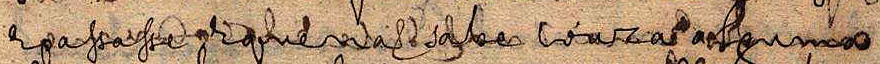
E passasse de que naõ sabe couza alguma
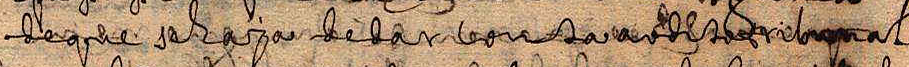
de que se haja de dar conta ao dito tribunal
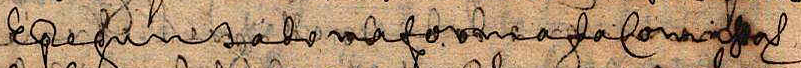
E preguntado na forma da Comissaõ
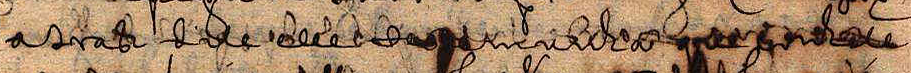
atras dice elle testemunha que conhece
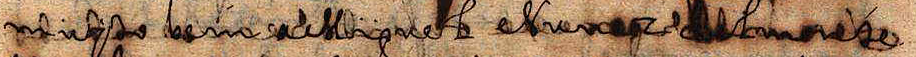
mujto bem a Miguel Nunez Belmonte
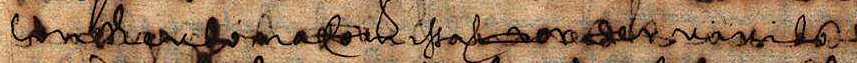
comtheudo na Comissaõ por ter uiuido
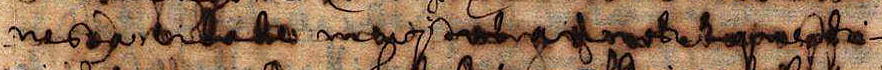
nesta Cidade mujtos annos E que di
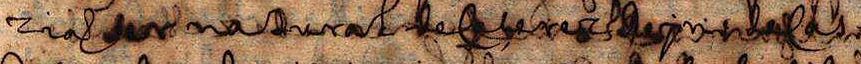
ziaõ ser natural de Caçerez Rejno de Cas
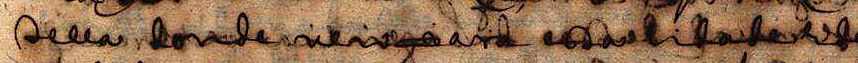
tella donde ueio para esta cidade E de
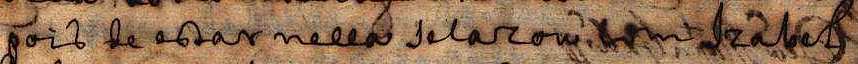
pois de estar nella se cazou com Izabel
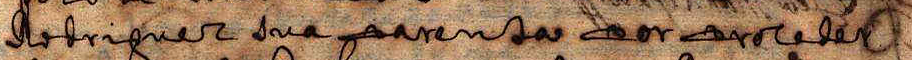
Rodriguez sua parenta por proceder
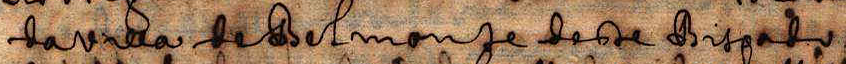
da villa de Belmonte deste Bispado
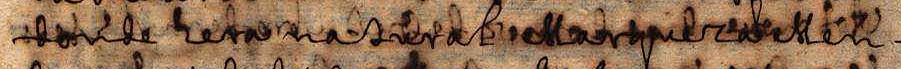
donde hera natural Marqueza Men
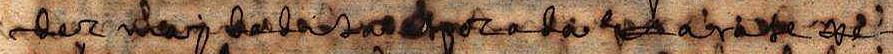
dez maj da dita espozada E para se Re
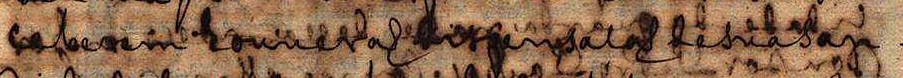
ceberem houueraõ dispensaçaõ de sua san
